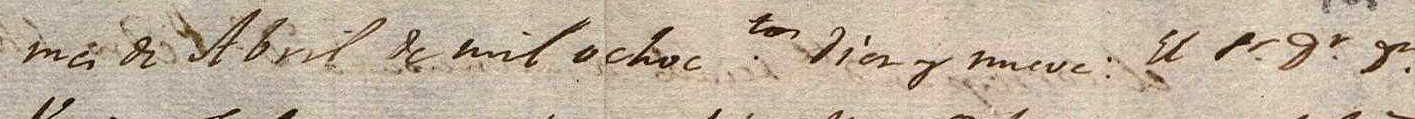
mes de Abril de mil ochoc.tos diez y nueve: El Sr. D.r D.n
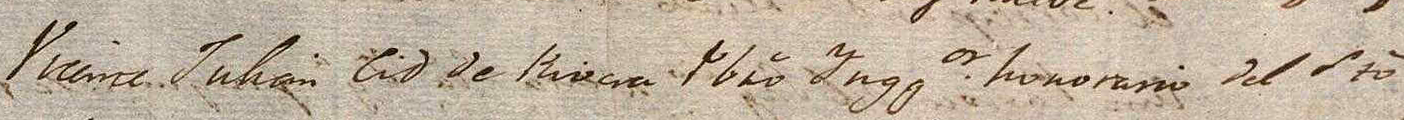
Vicente Iulian Cid de Rivera Pbrō Ynqq.or honorario del Sto
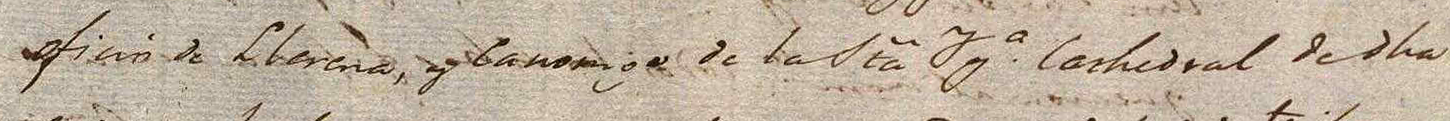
oficio de Llerena, y canonico de la Stā Yg.a Cathedral de dha
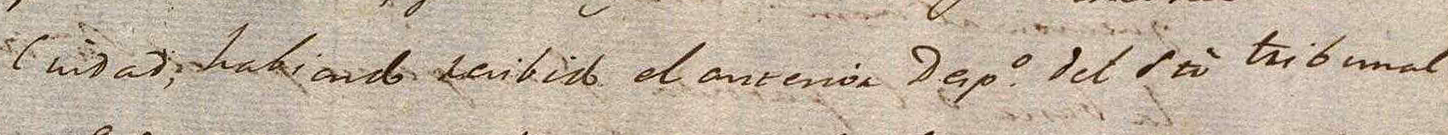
Ciudad, habiendo recibido el anterior Desp.o del stō tribunal
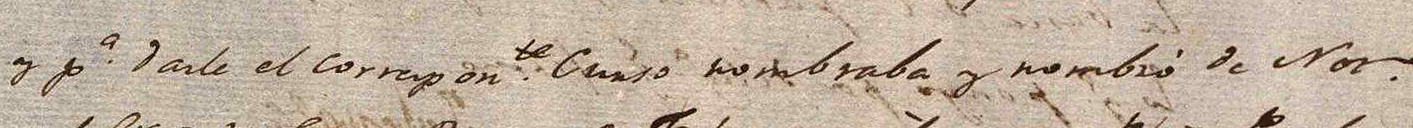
y p.a darle el correspon.te Curso nombraba y nombró de Not.o
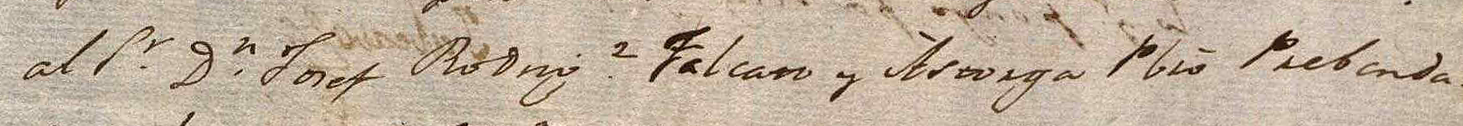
al S.r D.n Iosef Rodrig.z Falcato y Astorga Pbrō Prebenda
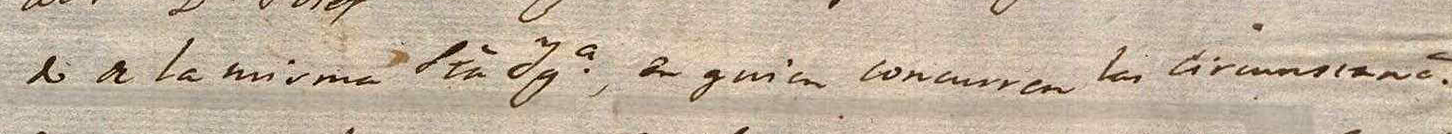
do de la misma Stā Yg.a, en quien concurren las cincunstanc.s
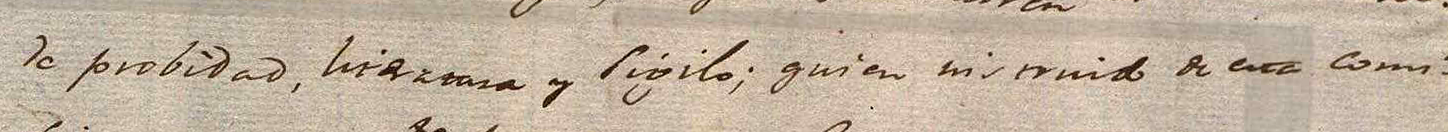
de probidad, literatura y sigilo; quien instruido de esta comi
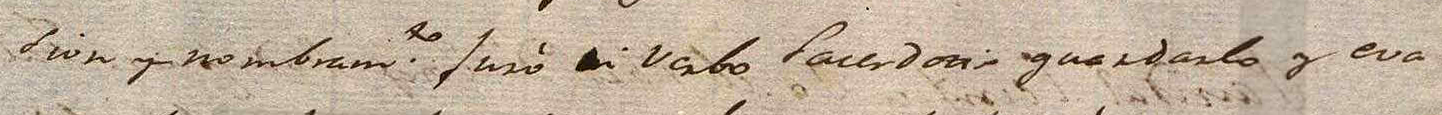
sion y nombram.to juró in verbo Sacerdotis guardarlo y eva
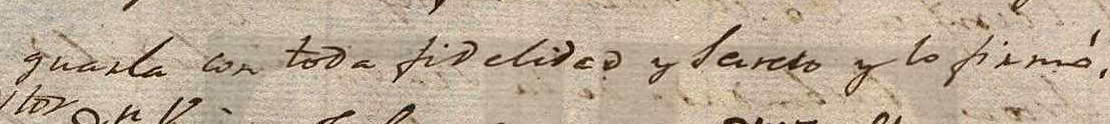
guarla con toda fidelidad y secreto y lo firmó.
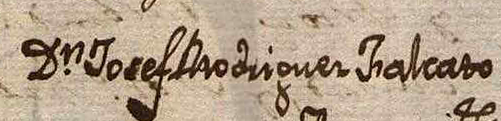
D.n Iosef Rodrigues Falcato
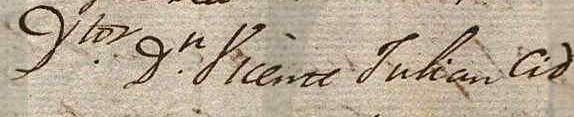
D.tor D.n Vicente Iulian Cid
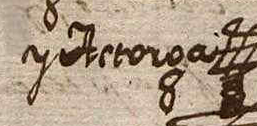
y Astorga
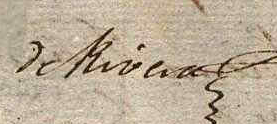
de Rivera
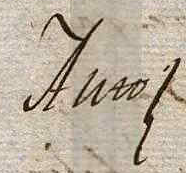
Auto
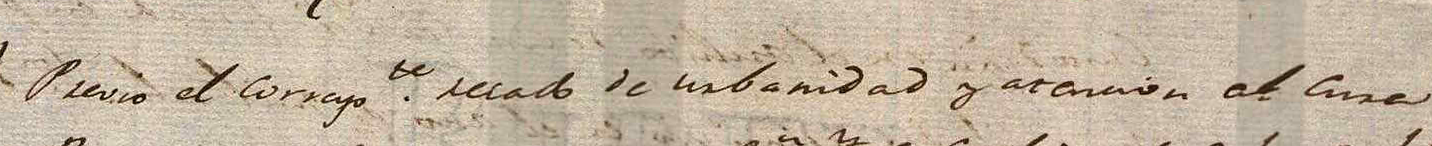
Previo el corresp.te recado de urbanidad y atencion al cura
